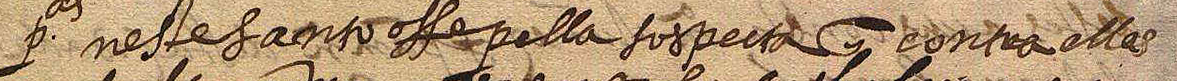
p.as neste santo offo pella sospeita q̄ contra elles
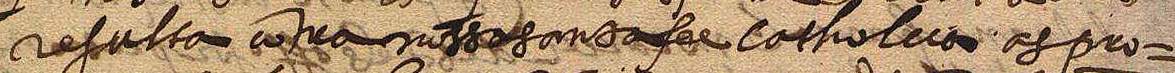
resulta cōtra nossa santa fee catholica as pro
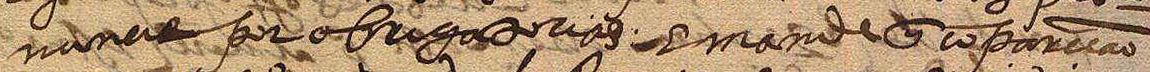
nuncie por obrigatorias. E mande q̄ cōpareçaõ
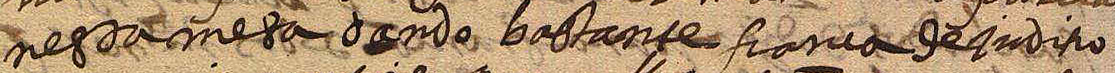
nesta mesa dando bastante fiança de Juditio
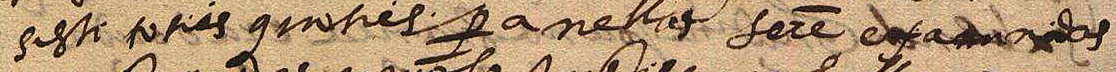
sisti totiis quosies ꝑa nellas serē examinadas
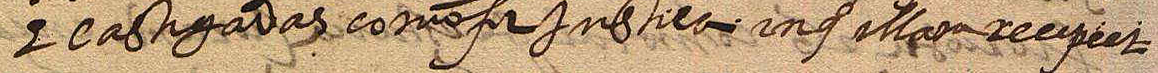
e castigadas como for Justiça in qo illam recepiet
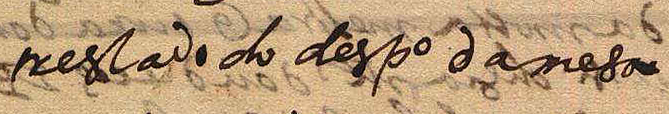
treslado do despo da mesa
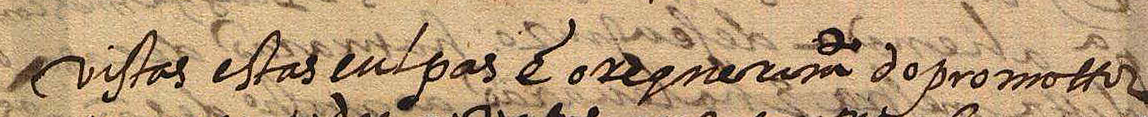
vistas estas culpas e o requerimto do promottor
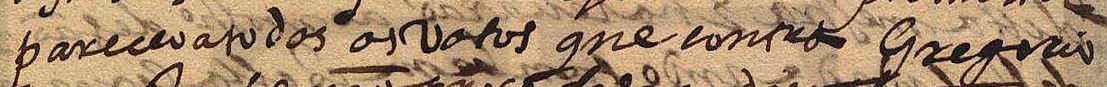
pareceo a todos os votos que contra Gregorio
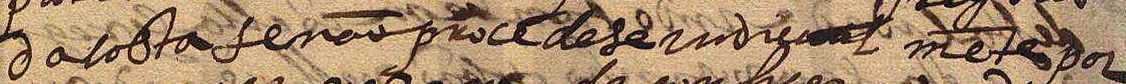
da costa se não procedese judicialmēte por
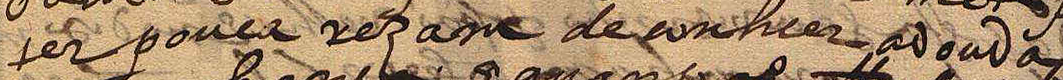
ter pouca rezam de conhecer a douda
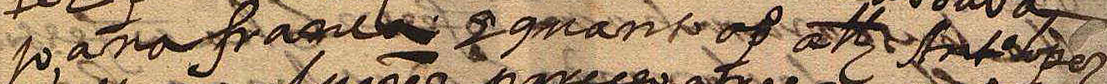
Joana franca E quanto a po āllz Anto lopez
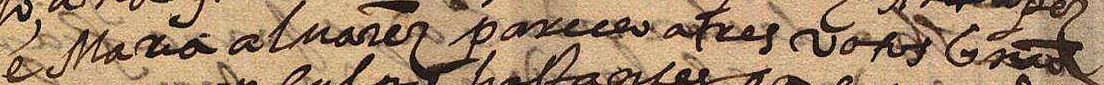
e Maria aluarez pareceo a tres votos q̄ não
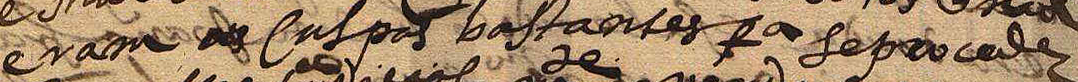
eram as Culpas bastantes ꝑa se proceder
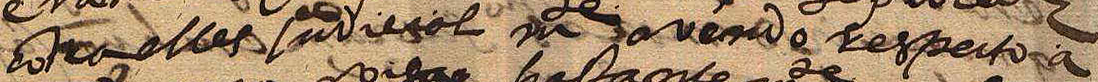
cōtra elles judicialmte avendo respeito a
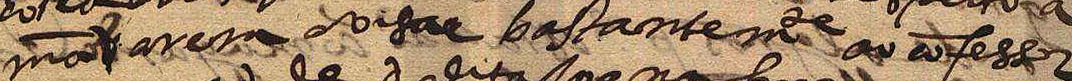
mādarem avisar bastantemte ao cōfessor
